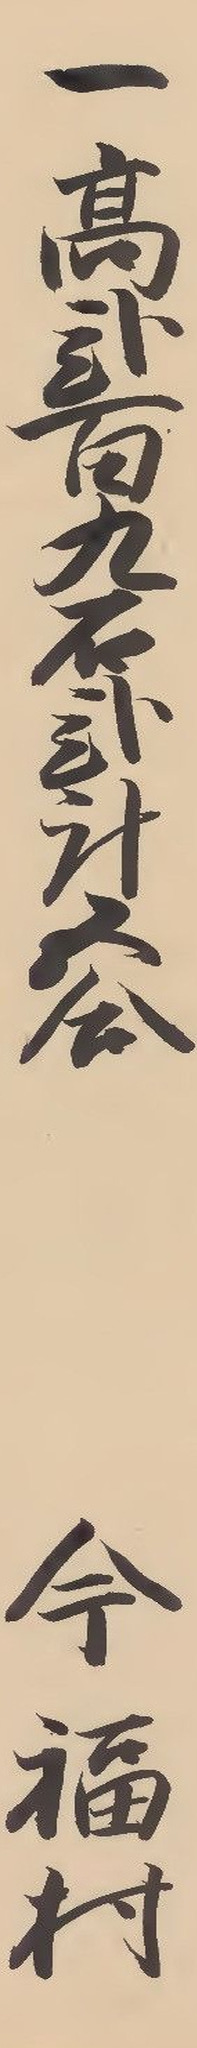一高弍百九石弐斗五合今福村
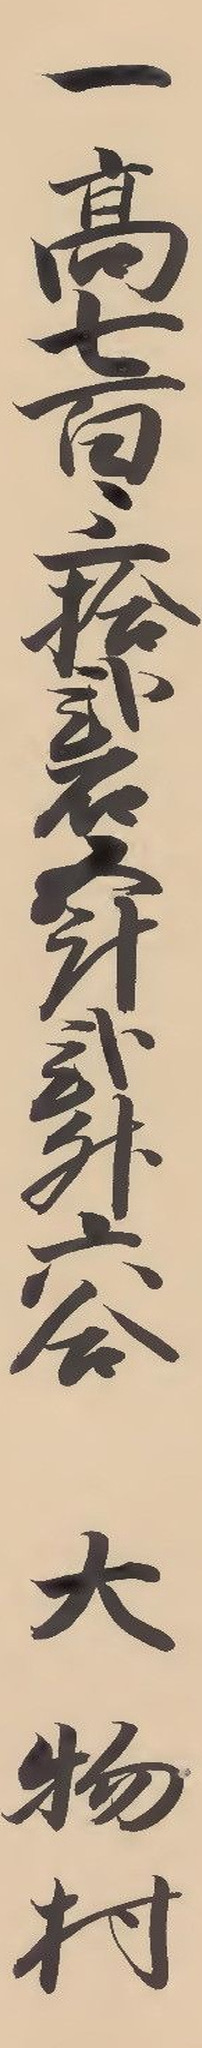一高七百三拾弐石五斗弐升六合大物村
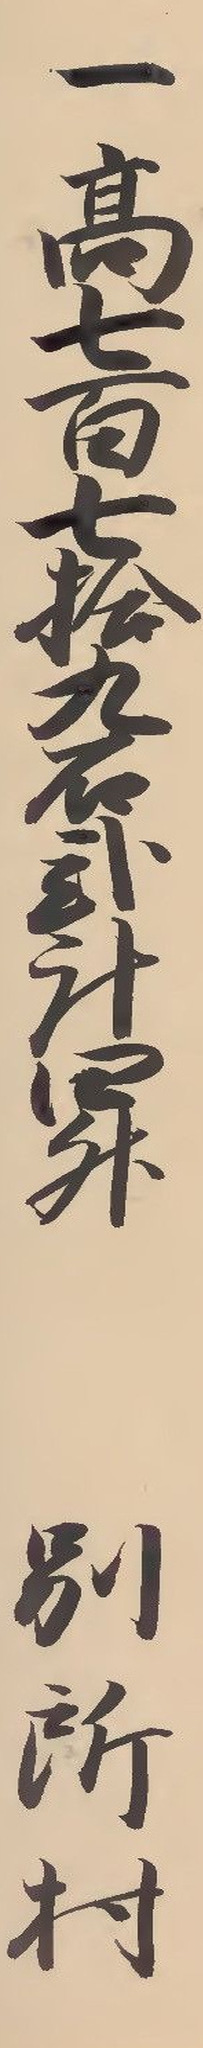一高七百七拾九石弐斗四升別所村
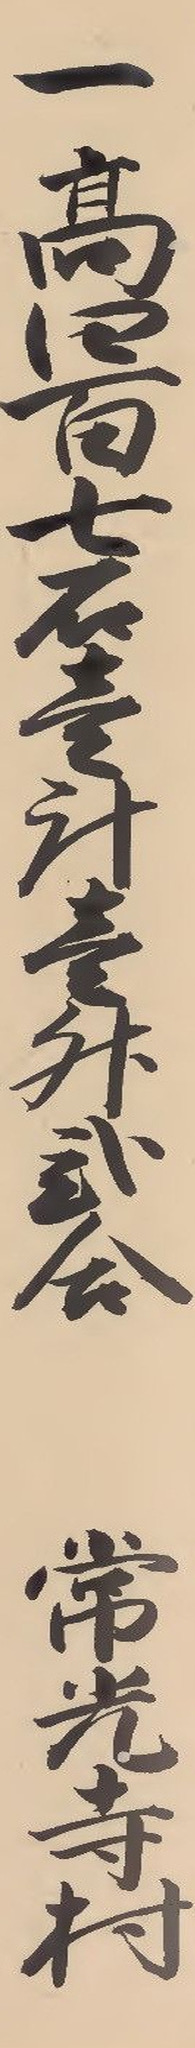一高四百七石壱斗壱升弐合常光寺村
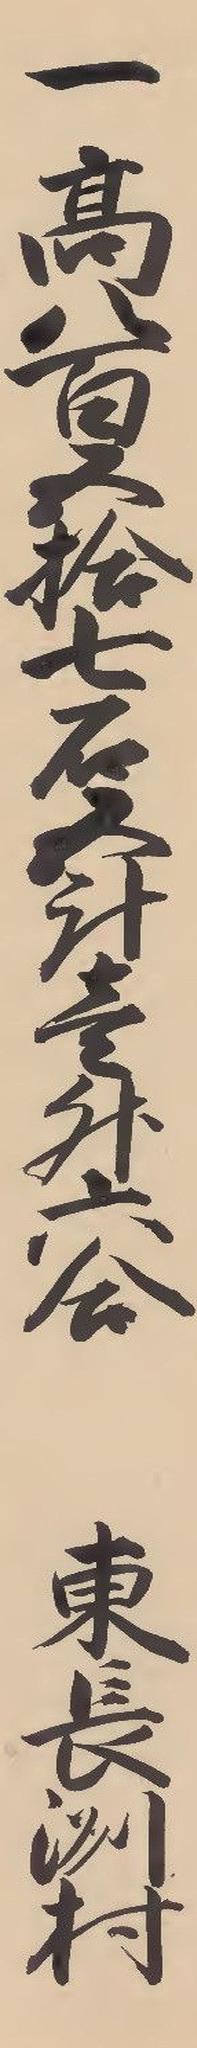一高八百五拾七石五斗壱升六合東長洲村
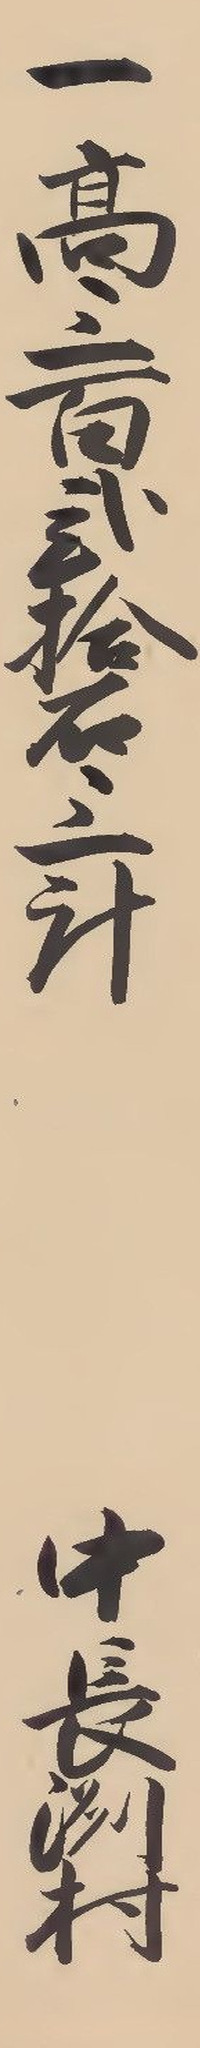一高三百弐拾石三斗中長洲村
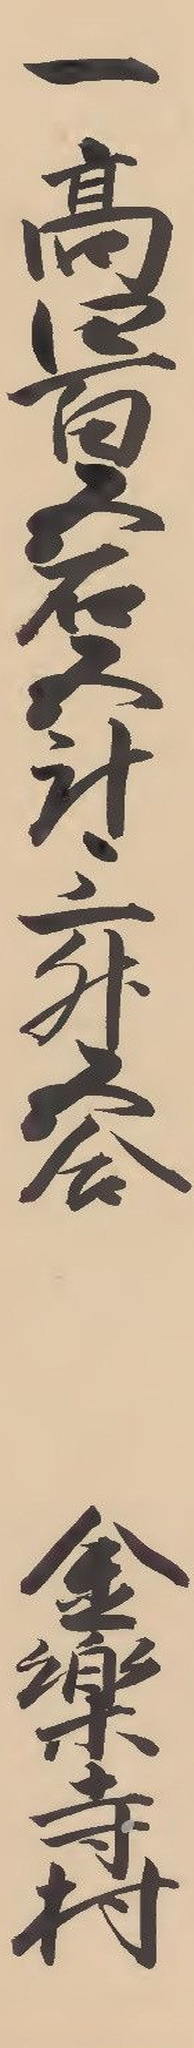一高四百五石五斗三升五合金楽寺村

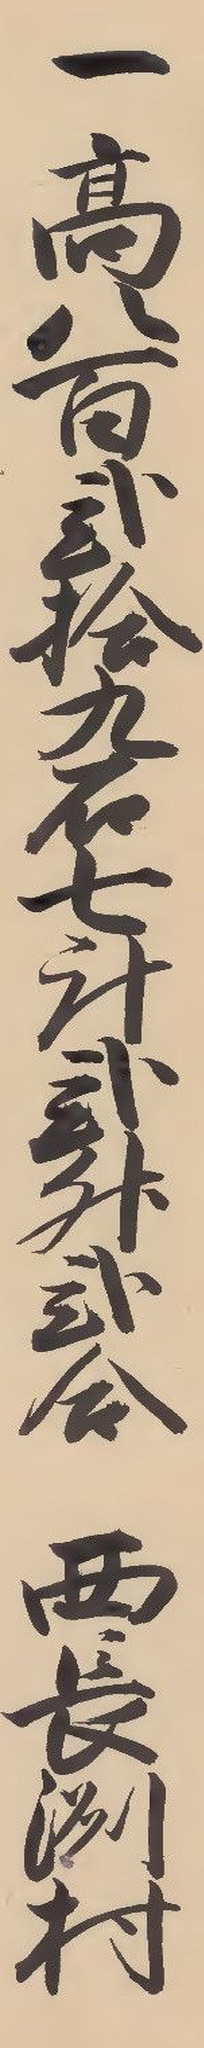一高八百弐拾九石七斗弐升弐合西長洲村
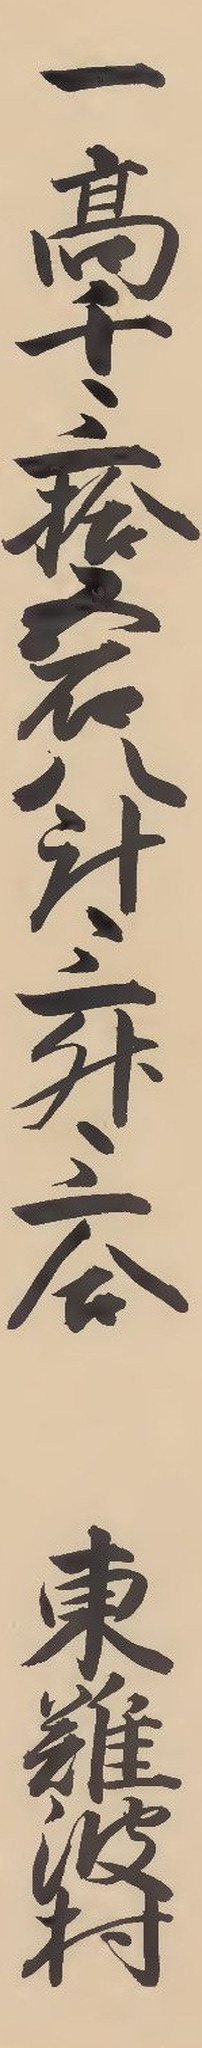一高千三拾五石八斗三升三合東難波村
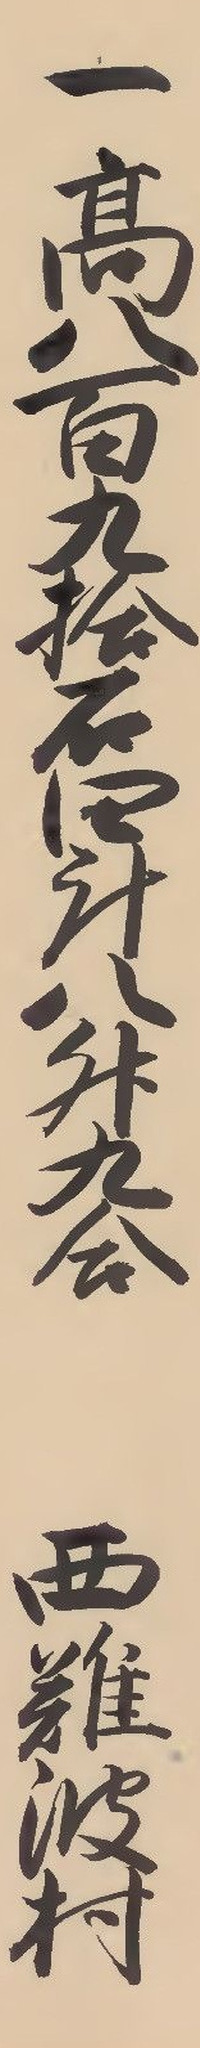一高八百九拾石四斗八升九合西難波村
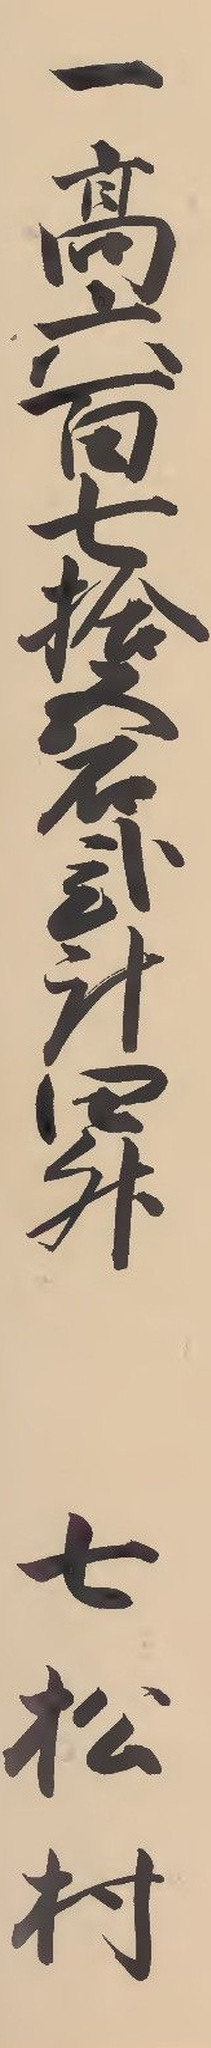一高六百七拾五石弐斗四升七松村
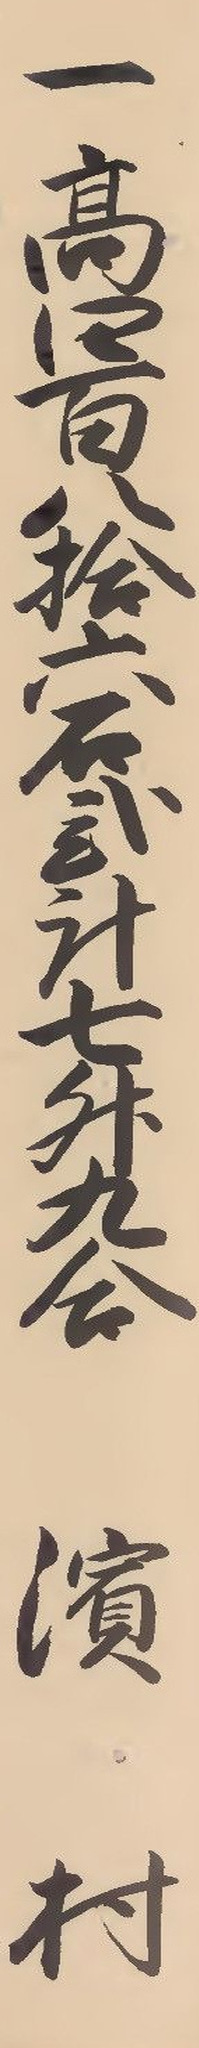一高四百八拾六石弐斗七升九合浜村
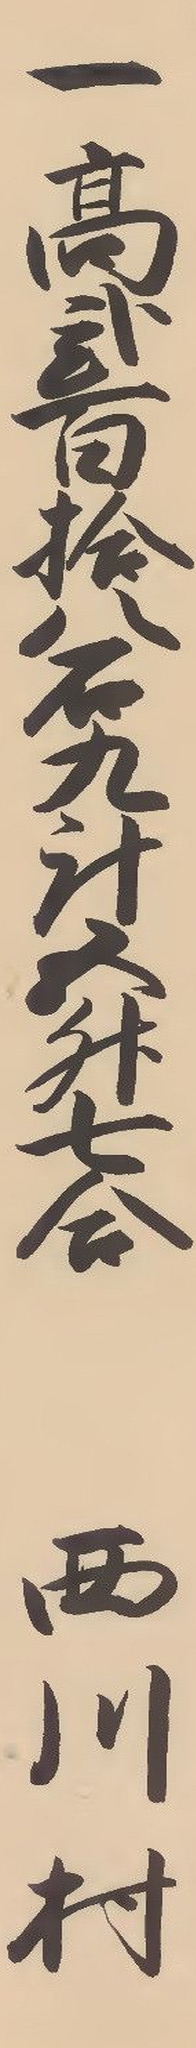一高弍百拾八石九斗五升七合西川村
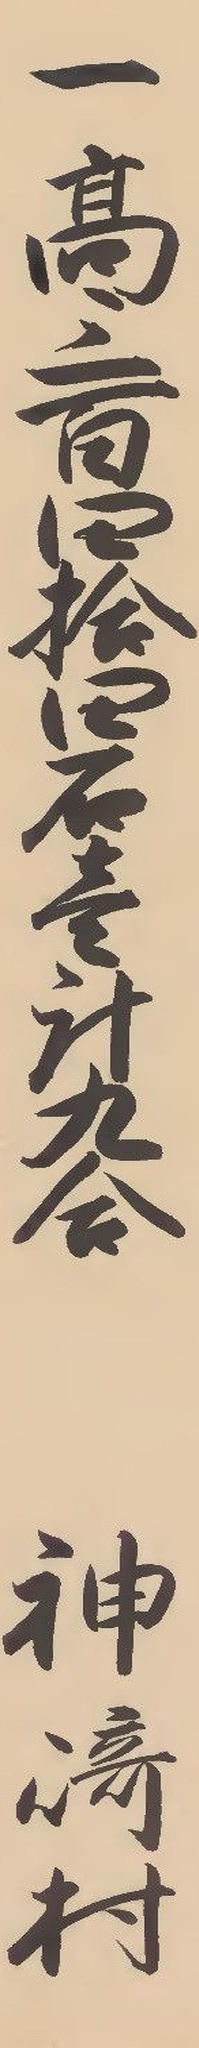一高三百四拾四石壱斗九合神崎村
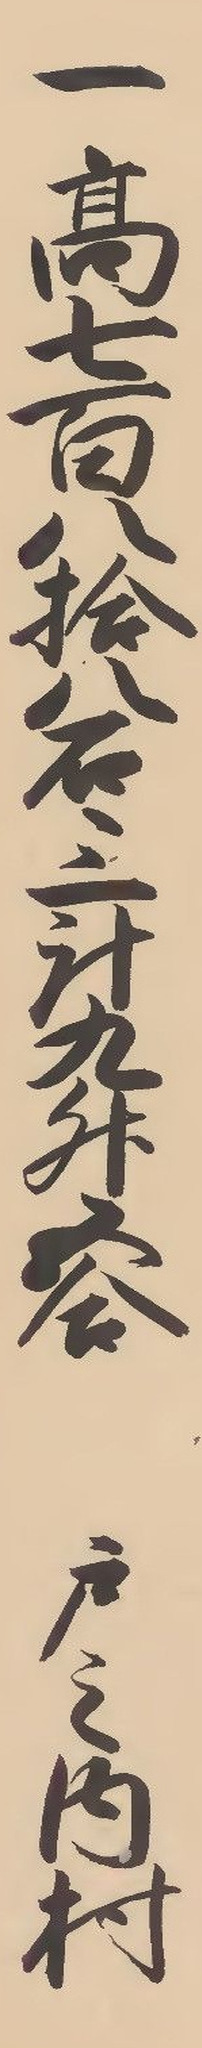一高七百八拾八石三斗九升五合戸之内村

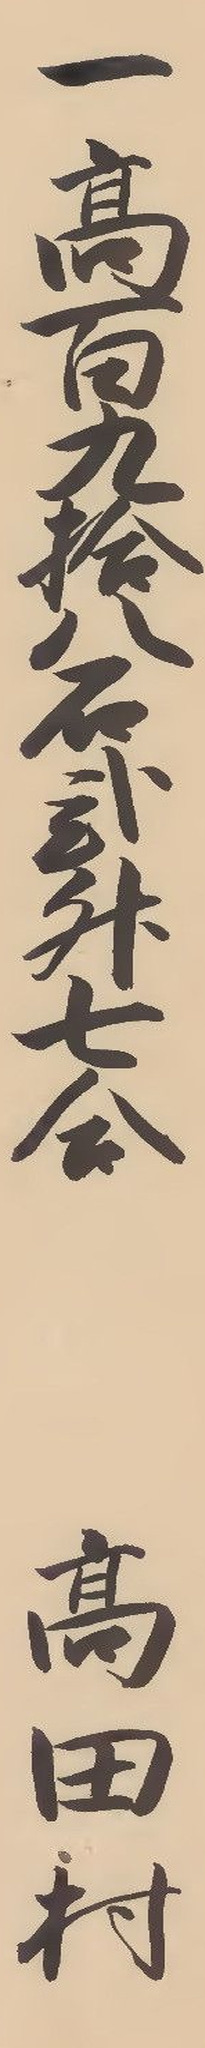一高百九拾八石弐升七合高田村
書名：摂津国郷帳
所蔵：国立公文書館 National Archives of Japan
